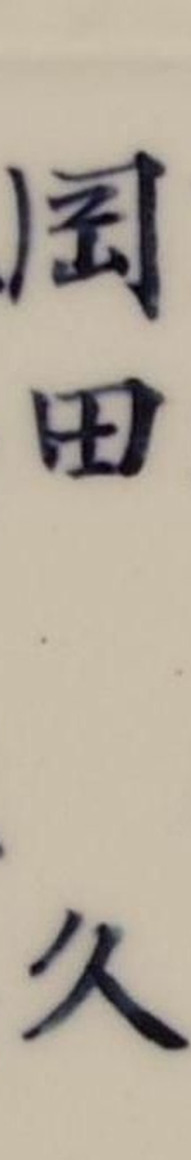岡田久
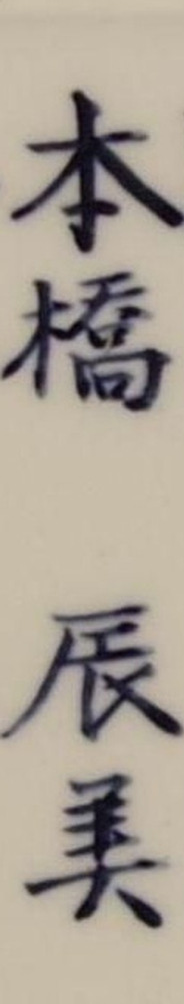本橋辰美
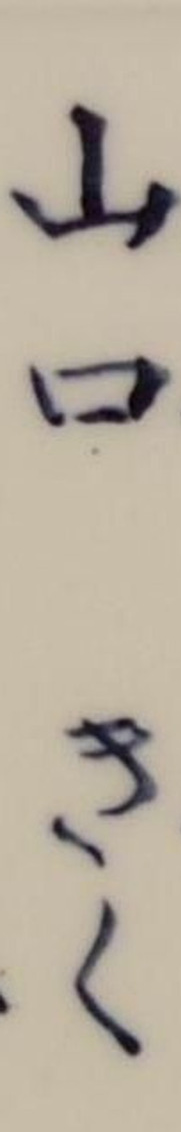山口きく
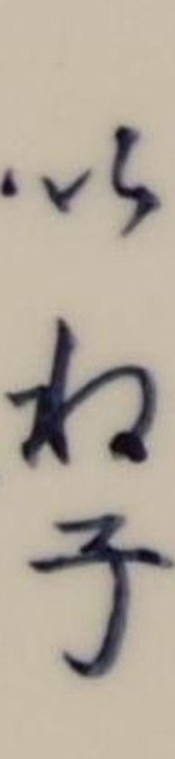いね子
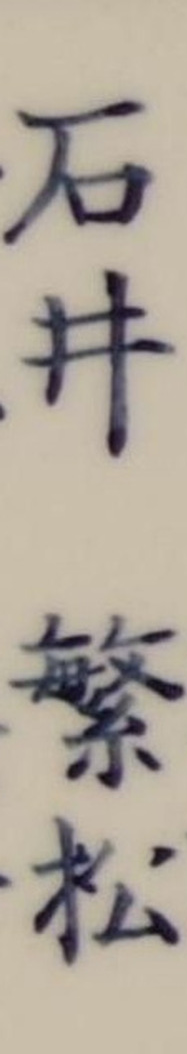石井繁松
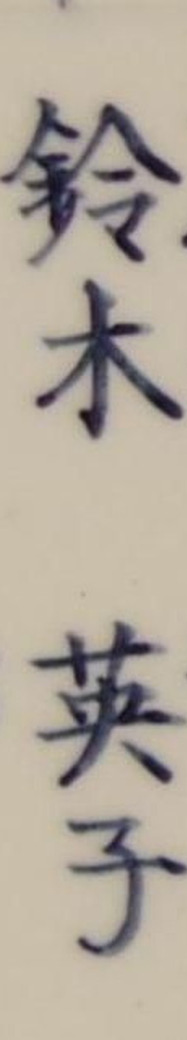鈴木英子

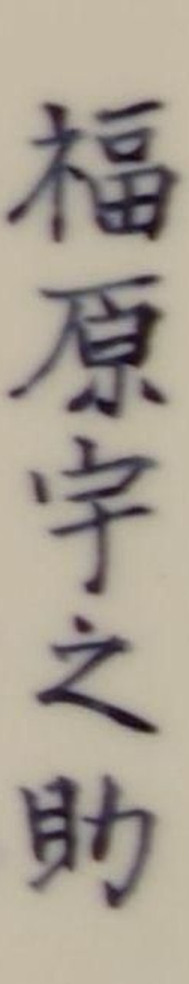福原宇之助
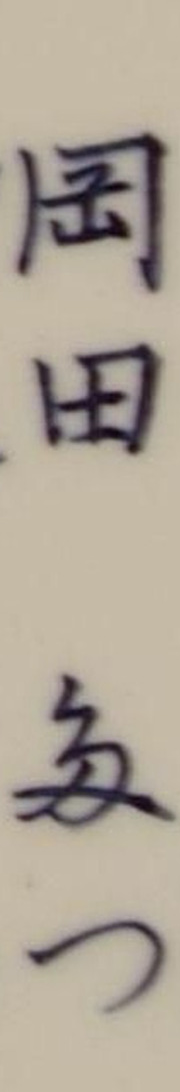岡田たつ
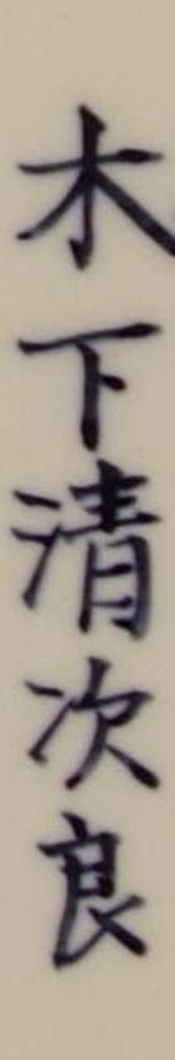木下清次良
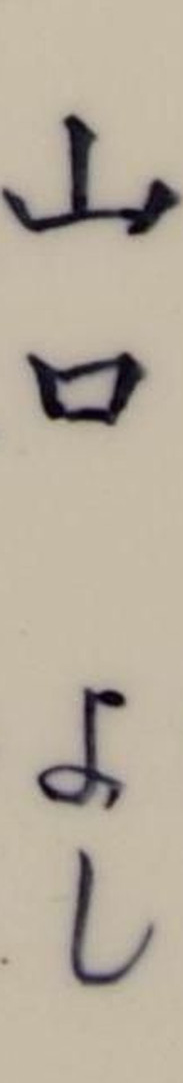山口よし
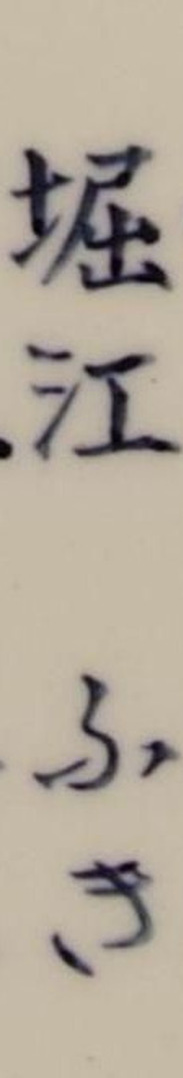堀江ふき
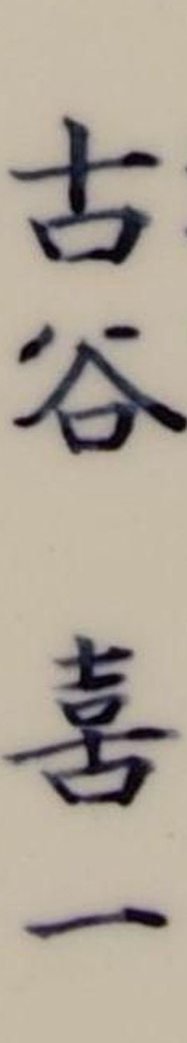古谷喜一
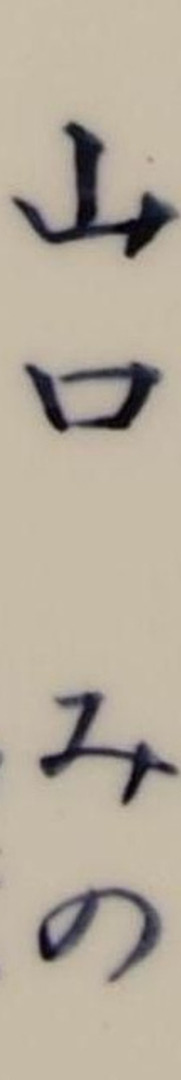山口みの
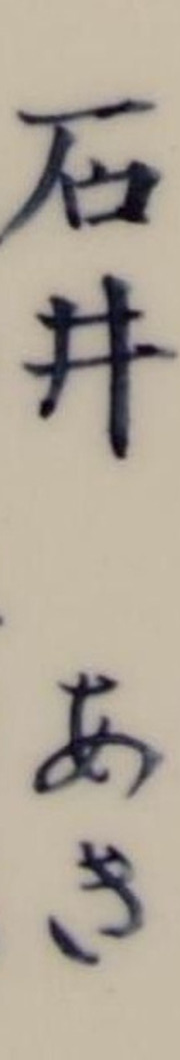石井あき
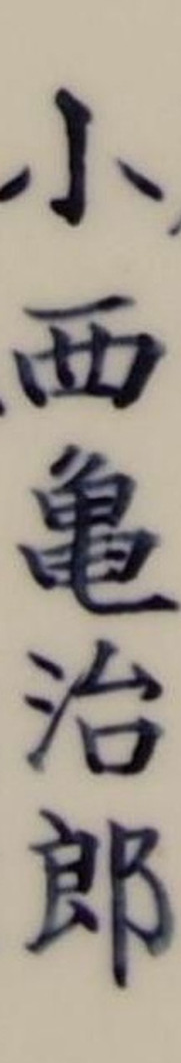小西亀治郎
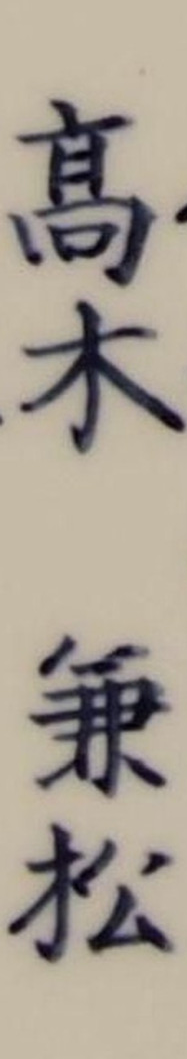高木兼松
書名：E~L
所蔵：高野山金剛峯寺
